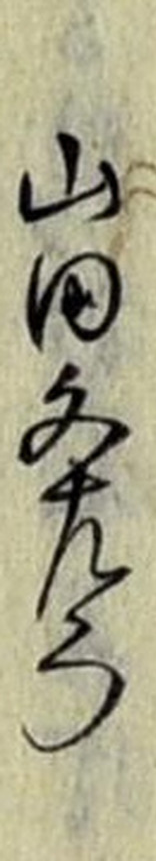山田文左衛門
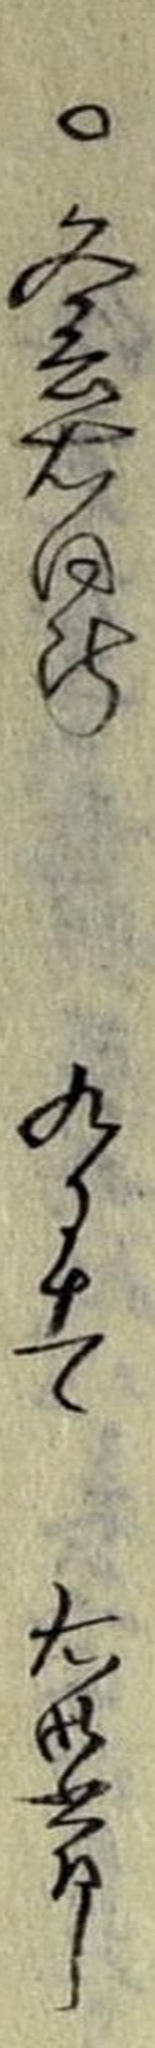〇文言右同断九月十一日右御書付之
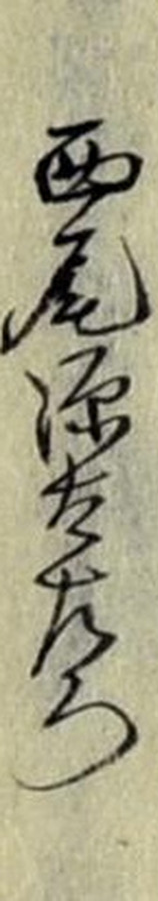西尾源太左衛門
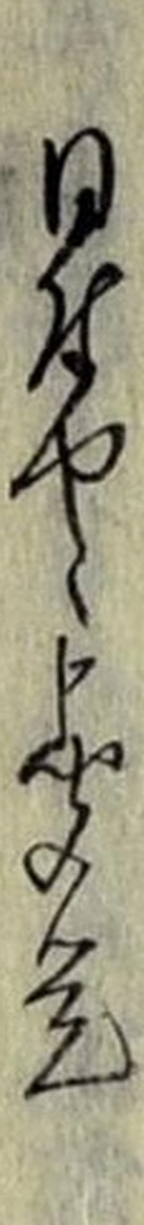目付中へ申聞覚
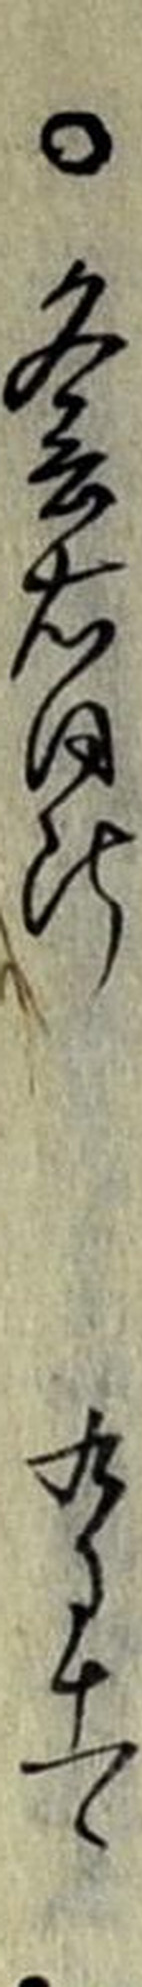〇文言右同断九月十一日
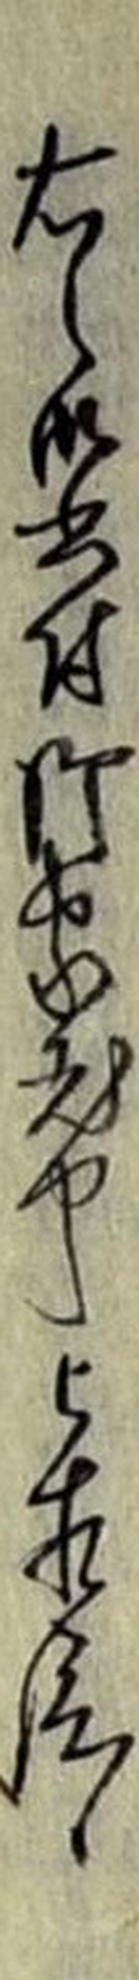右之御書付御家老中被相渡候

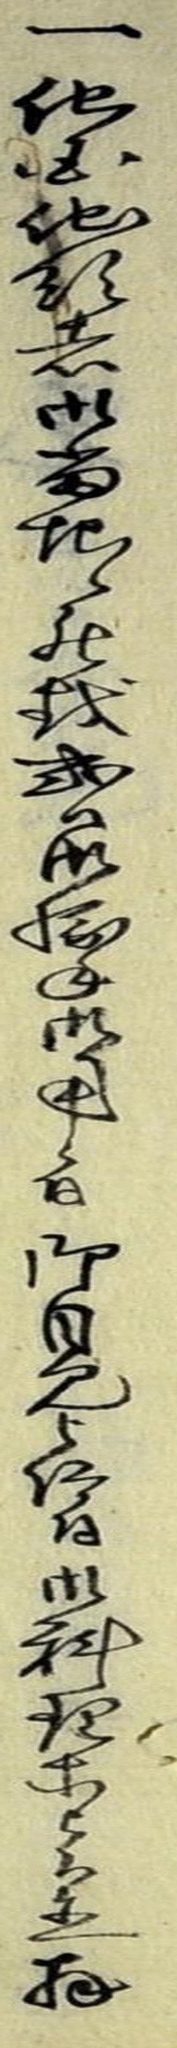一他国他領者御当地へ罷越或ハ御勝手御用ニ付御目見被仰付御料理等被下置拝
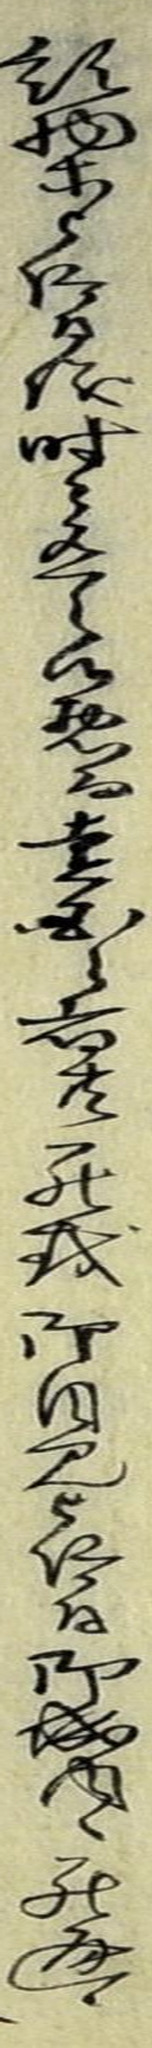領物等被仰付儀時々有之候惣而遠国之者共罷越御目見被仰付御城内へ罷通候
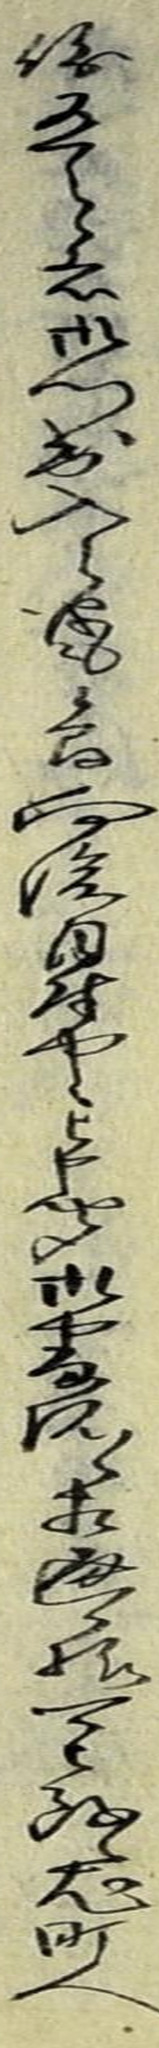儀有之候者御門出入之儀も候間向後目付中へ被申聞御番所へ相通候様可被致候尤町人
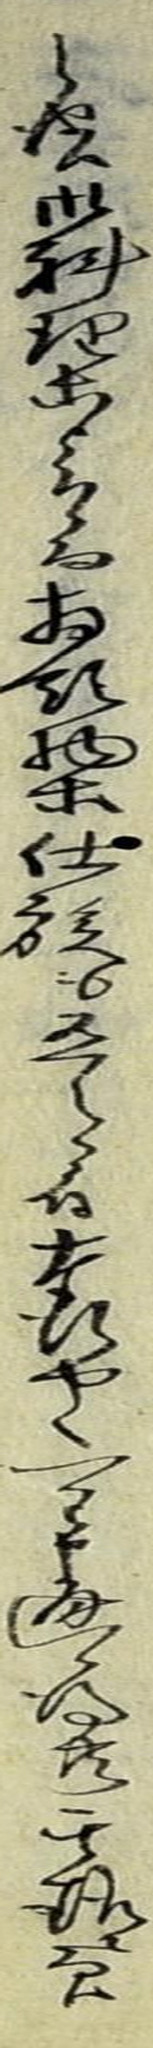之儀ハ御料理等被下候而拝領物等仕族も有之候ニ付奉行中へ可被申通候得共其趣ニ而ハ
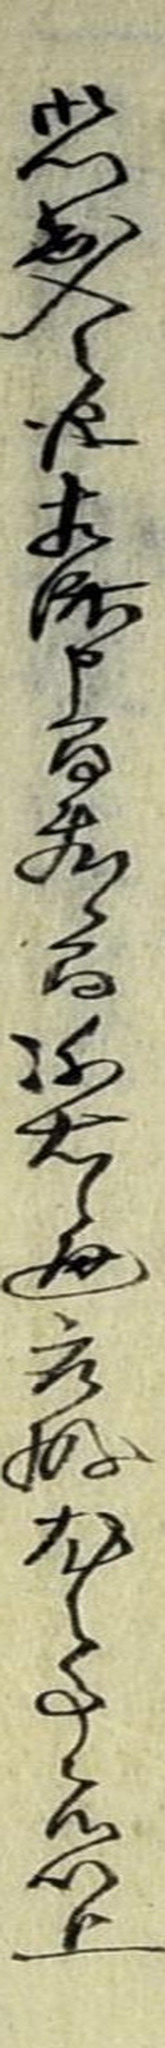御門出入之儀相済申間敷候間弥右之通取扱尤之事ニ候以上
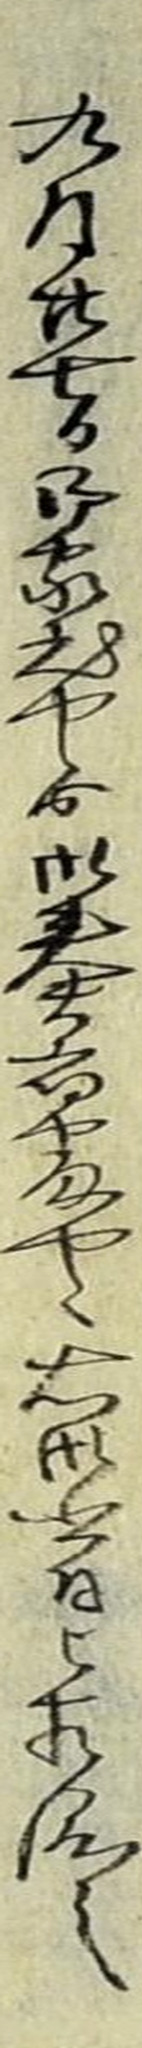九月廿七日御家老中ゟ御奏者番中へ右御書付被相渡之
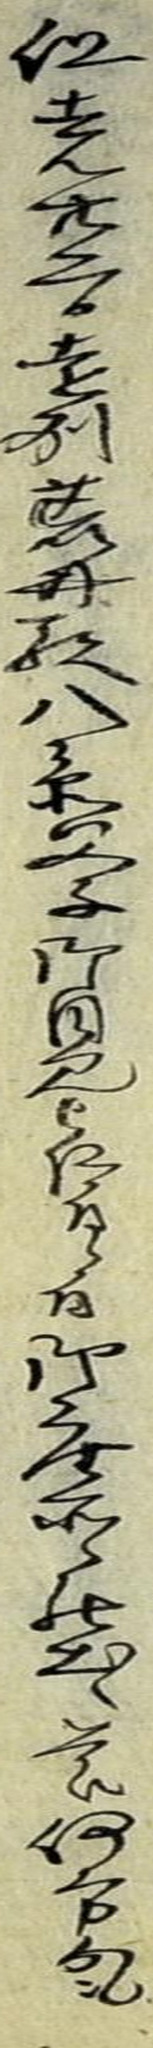但去ル廿二日遠州荒井駅八兵衛父子御目見被仰付候ニ付御座所へ罷出候節何方ゟも
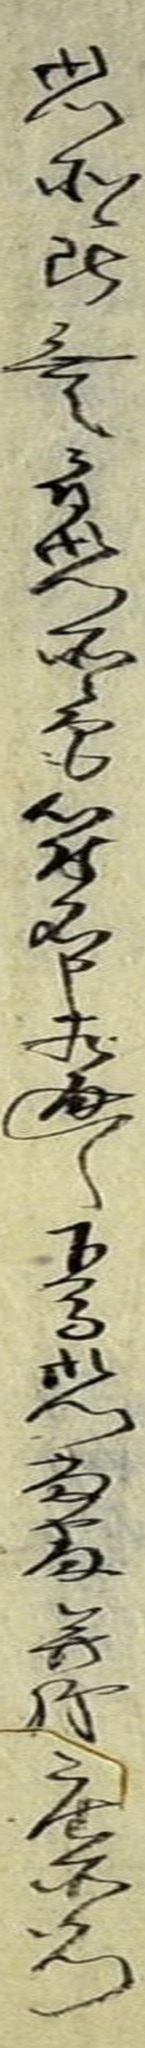御門所へ断無之ニ付御門所ニ而も心付不申相通し下馬御門当番并御座所御門
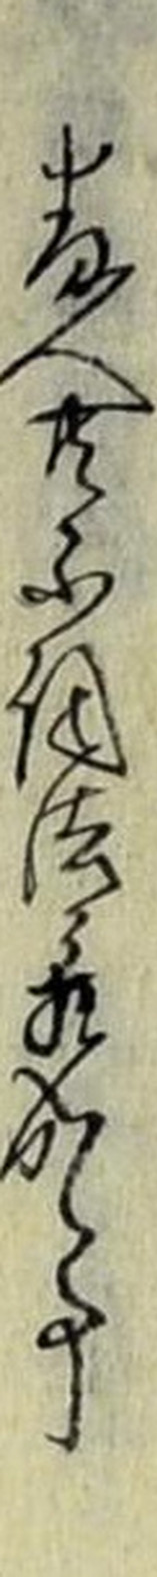番人共不調法ニ相成候事
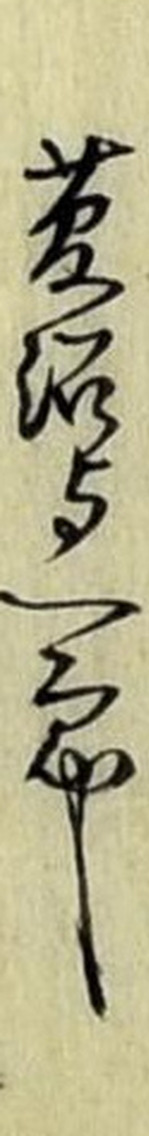菅沼与一郎
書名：命令之部 一
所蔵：福井県文書館 Fukui Prefectural Archives
